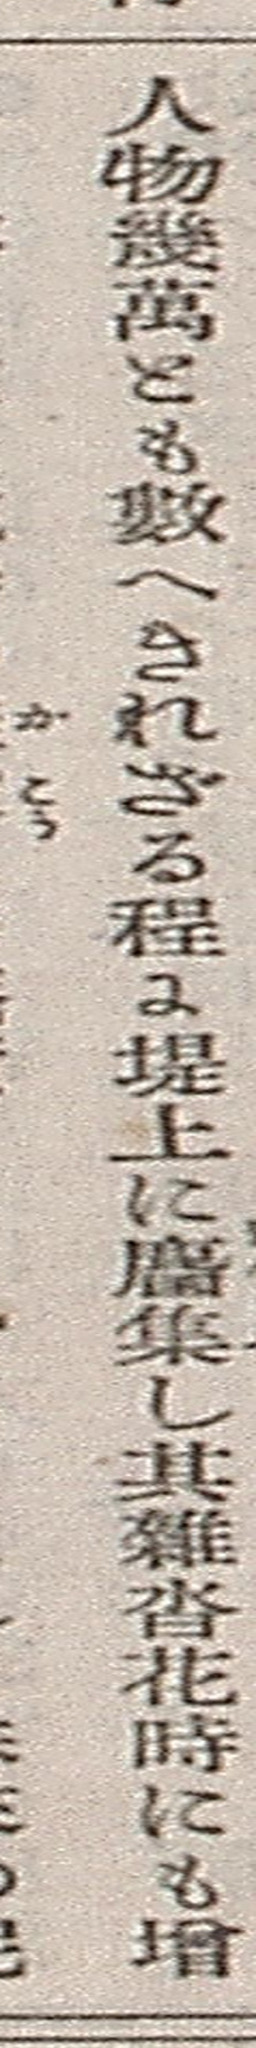人物幾万とも数へきれざる程に堤上に麕集し其雑沓花時にも増
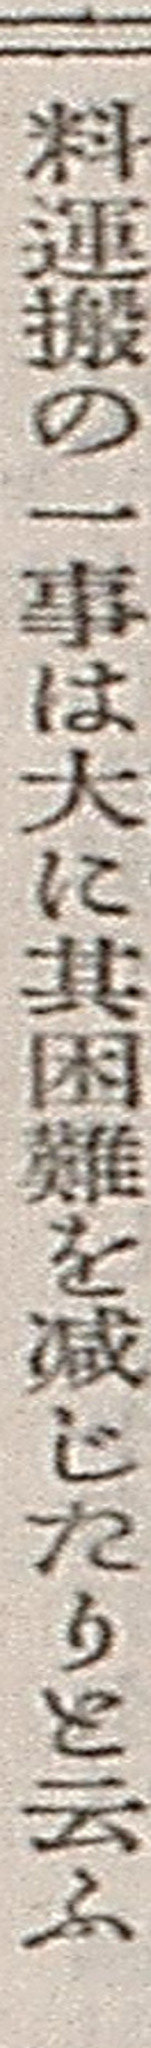料運搬の一事は大に其困難を減じたりと云ふ
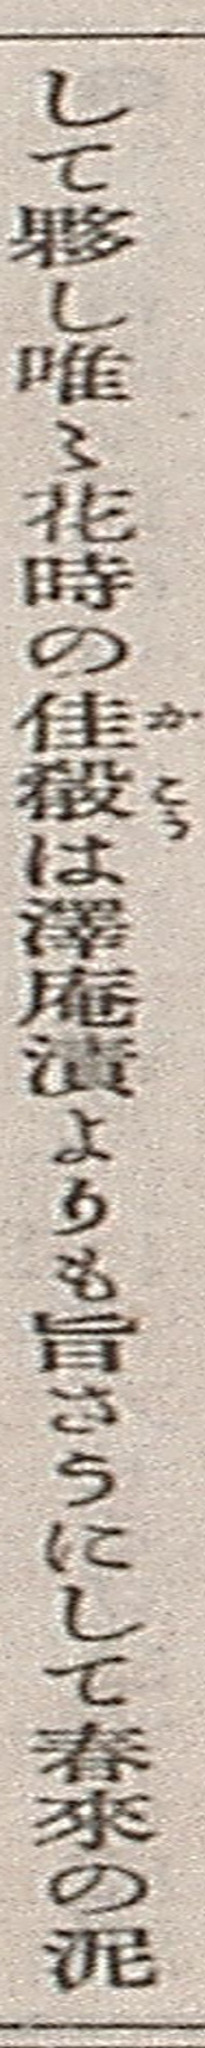して夥し唯々花時の佳殽は沢庵漬よりも旨さうにして春来の泥
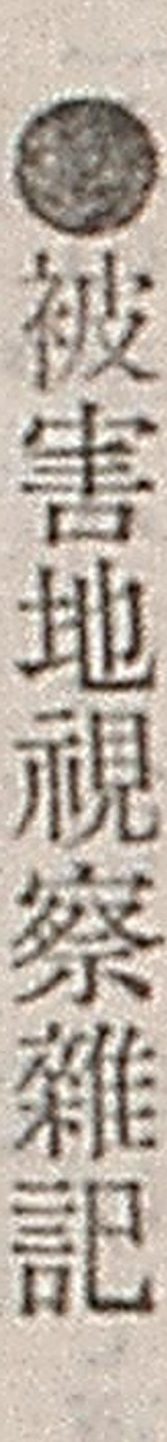●被害地視察雑記
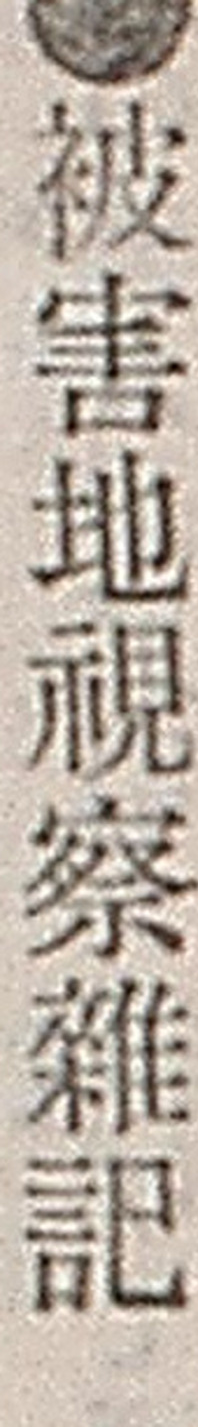●被害地視察雑記
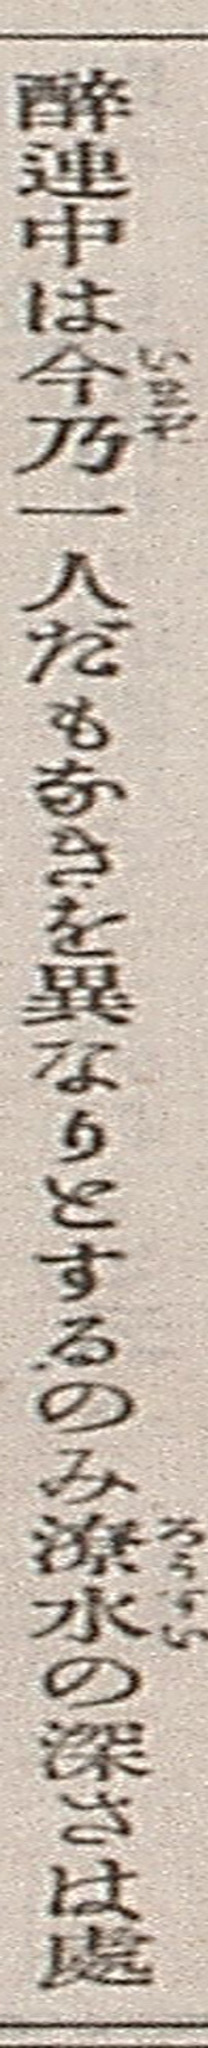酔連中は今乃一人だもなきを異なりとするのみ潦水の深さは処
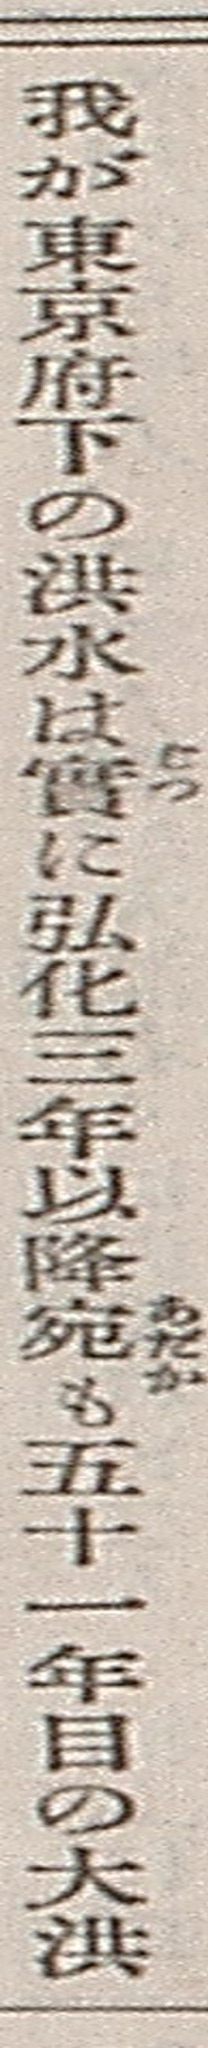我が東京府下の洪水は実に弘化三年以降宛も五十一年目の大洪
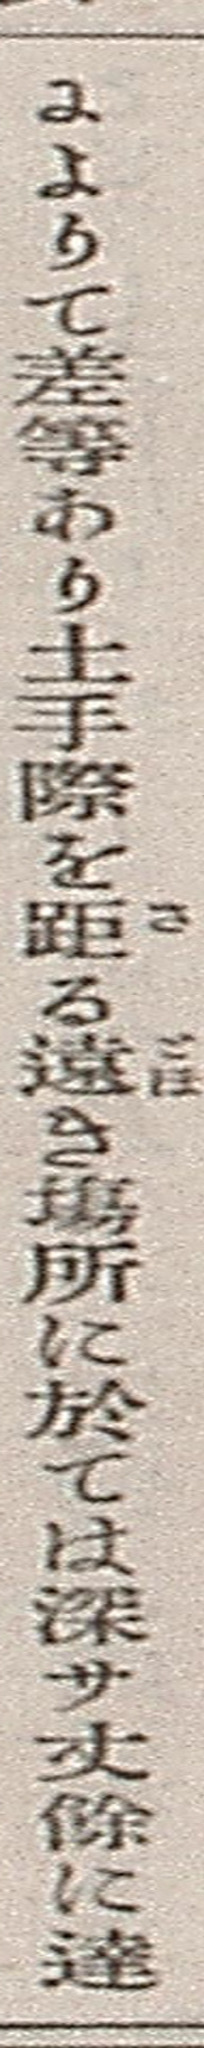によりて差等あり土手際を距る遠き場所に於ては深サ丈余に達
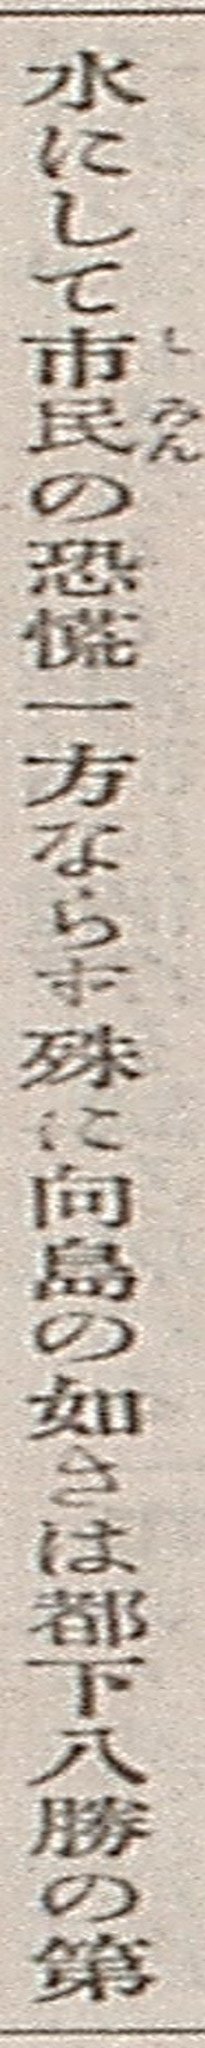水にして市民の恐怖一方ならず殊に向島の如きは都下八勝の第
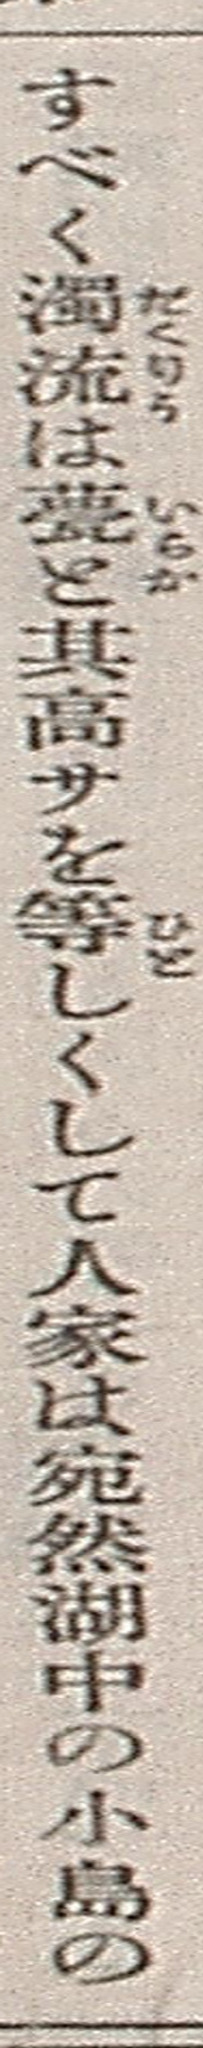すべく濁流は甍と其高サを等しくして人家は宛然湖中の小島の
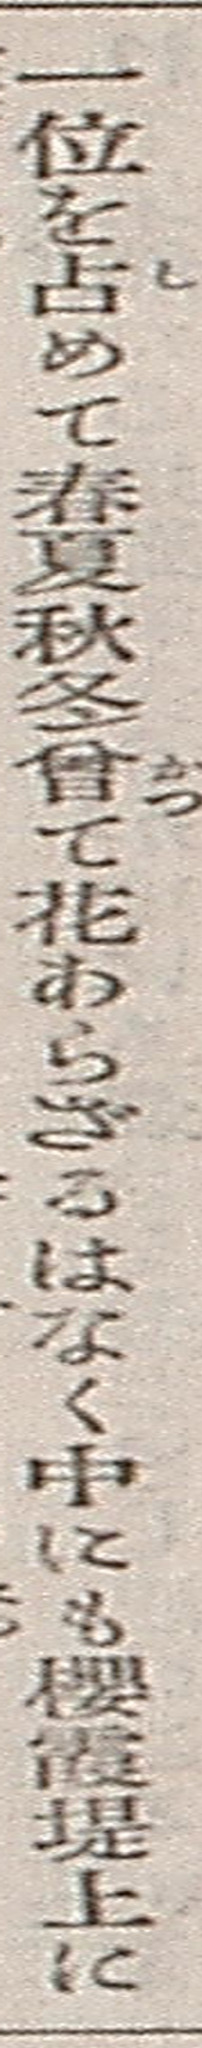一位を占めて春夏秋冬曾て花あらざるはなく中にも桜霞堤上に
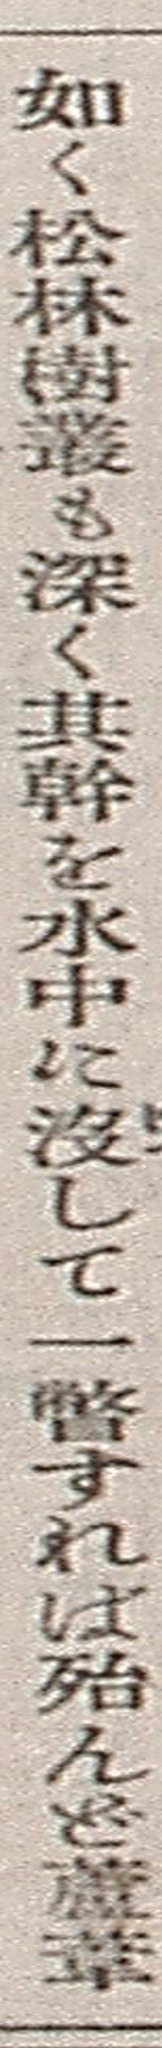如く松林樹叢も深く其幹を水中に没して一瞥すれば殆んど芦葦
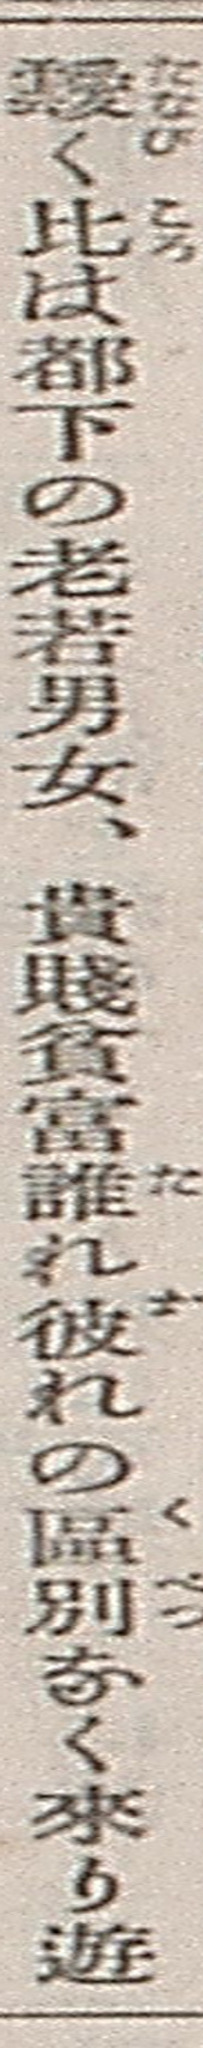靉く此は都下の老若男女、貴賤貧富誰れ彼れの区別なく来り遊
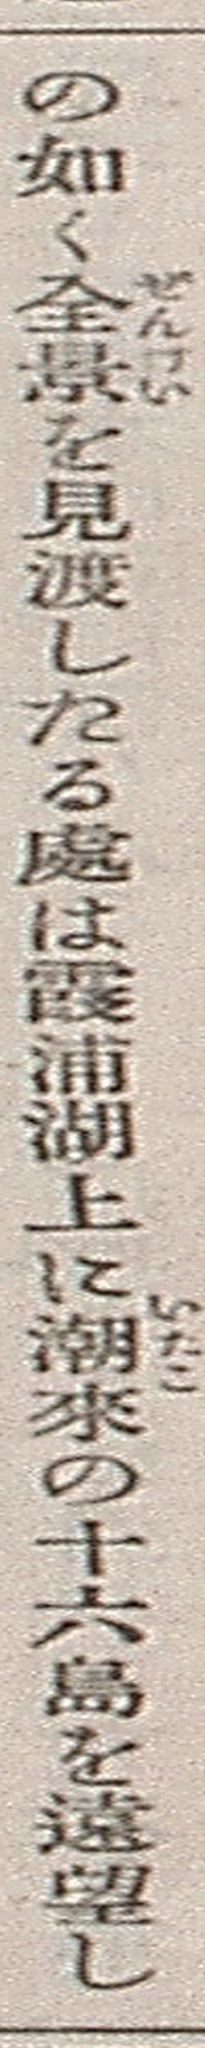の如く全景を見渡したる処は霞浦湖上に潮来の十六島を遠望し
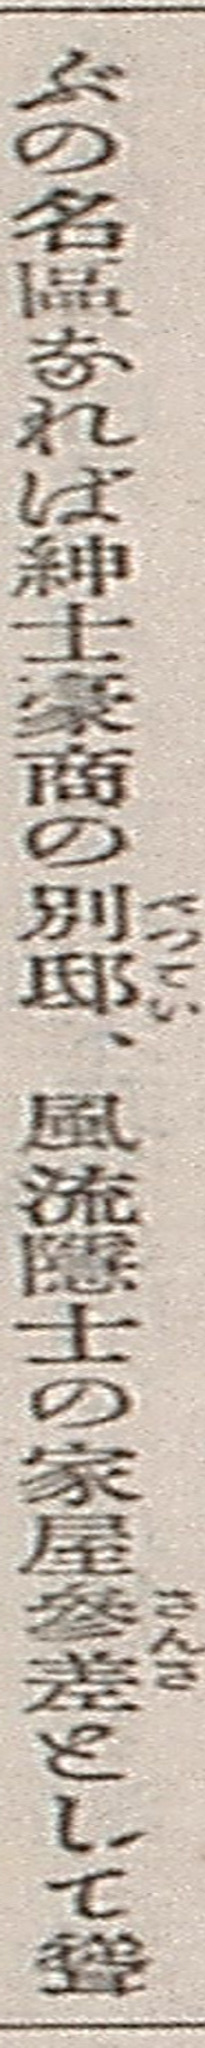ぶの名区なれば紳士豪商の別邸、風流隠士の家屋参差として聳
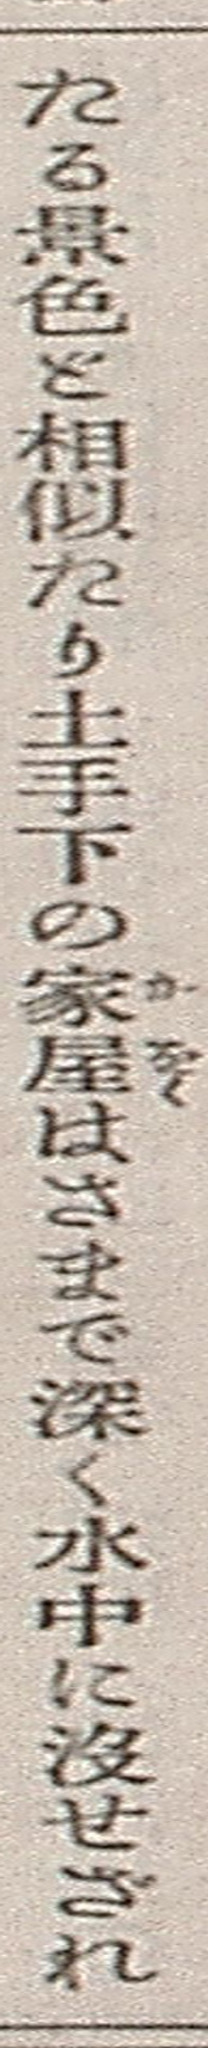たる景色と相似たり土手下の家屋はさまで深く水中に没せざれ
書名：風俗畫報臨時増刊第百二十四號　洪水地震被害録（上）
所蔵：東京大学地震研究所図書室 Earthquake Research Institute Library, The University of Tokyo, JAPAN
